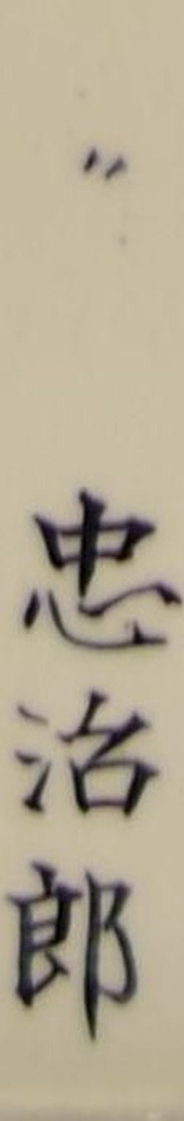忠治郎
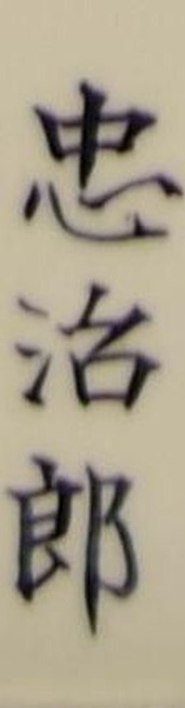忠治郎
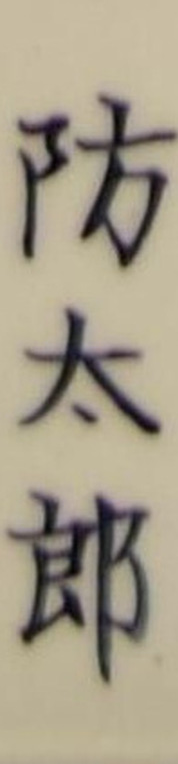防太郎
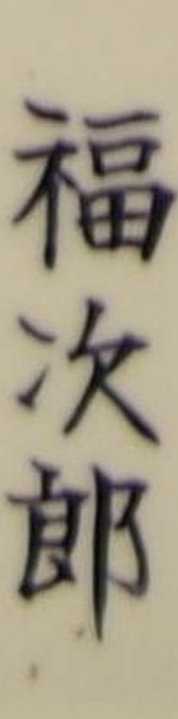福次郎
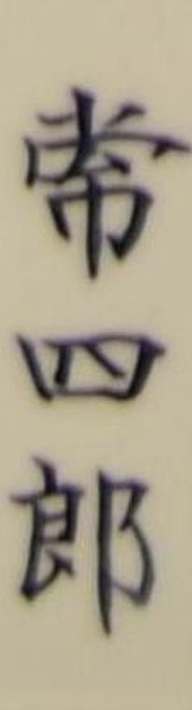常四郎

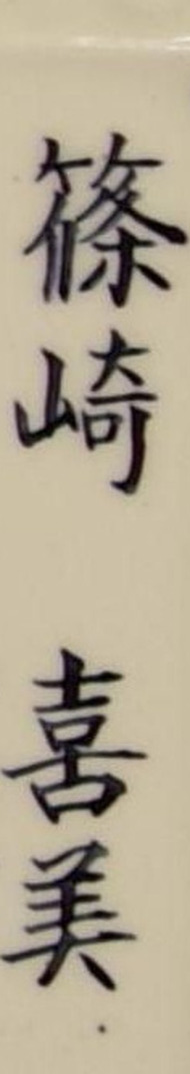篠崎喜美
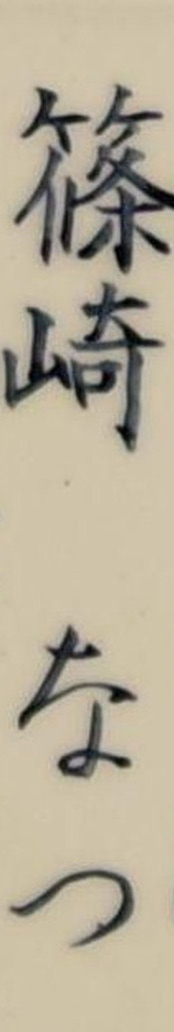篠崎なつ
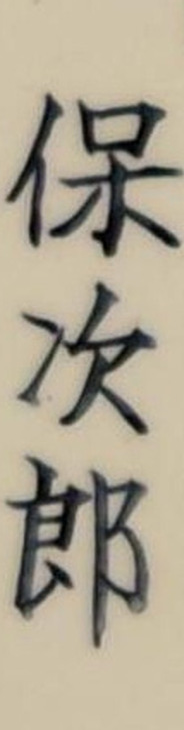保次郎
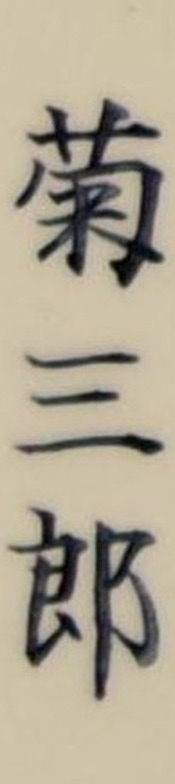菊三郎
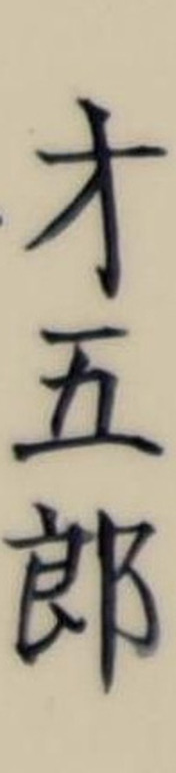才五郎
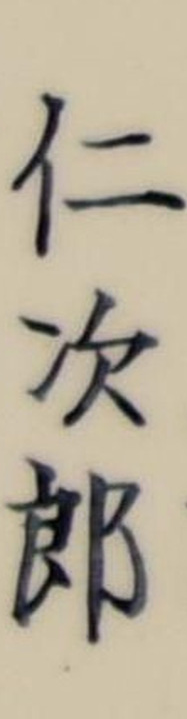仁次郎
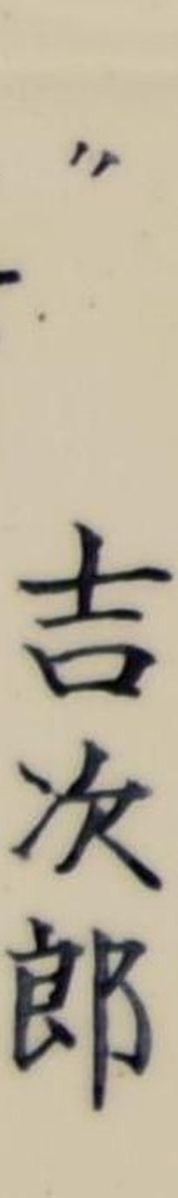吉次郎
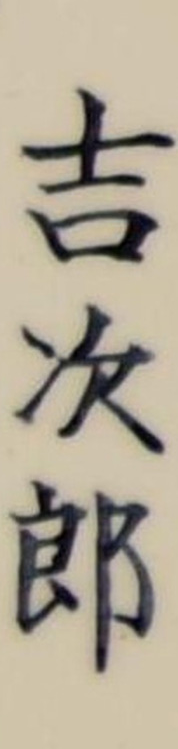吉次郎
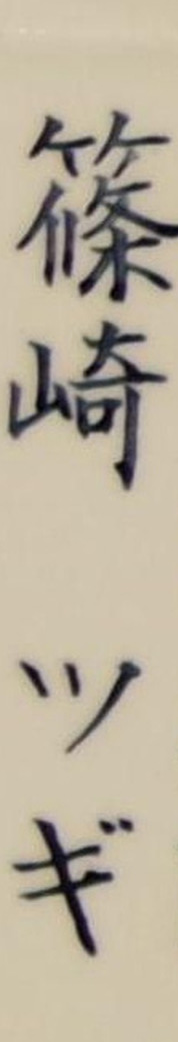篠崎ツギ
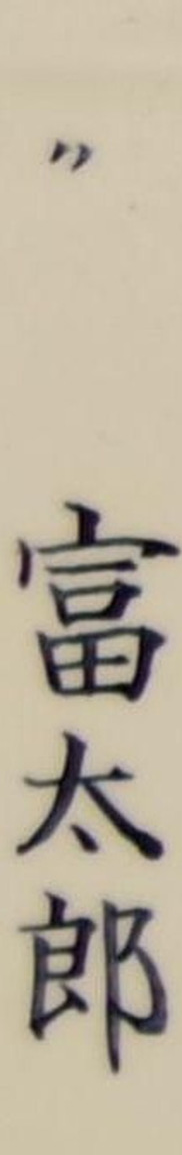富太郎
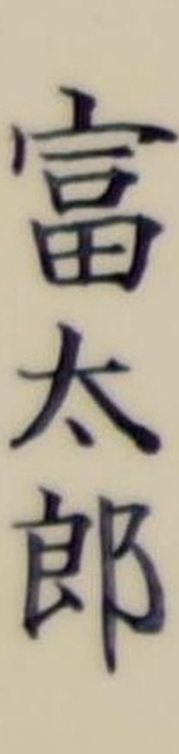富太郎
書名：A~D
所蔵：koyasan kongobuji
